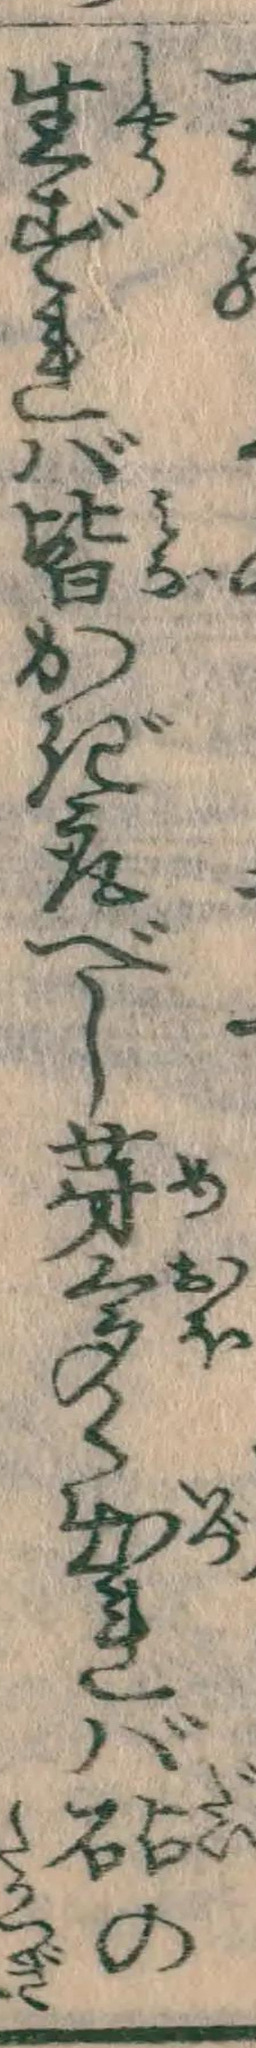生ずれば皆かぎ取べし芽多く出れば砧の
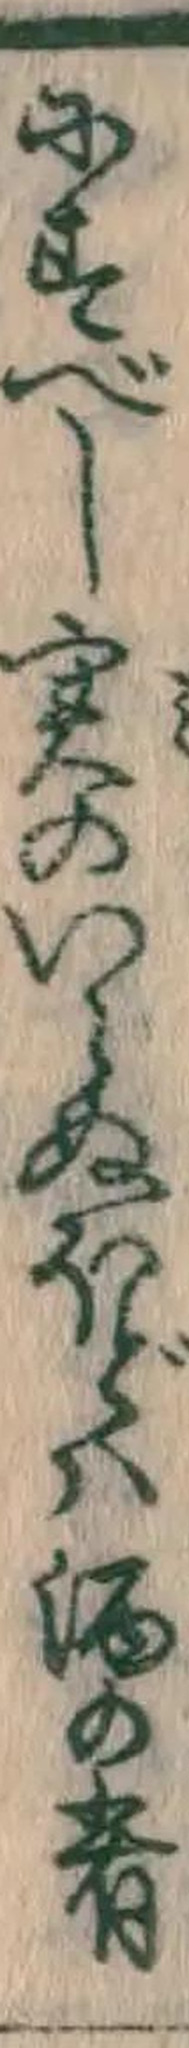にすべし実のいらぬほどは酒の肴
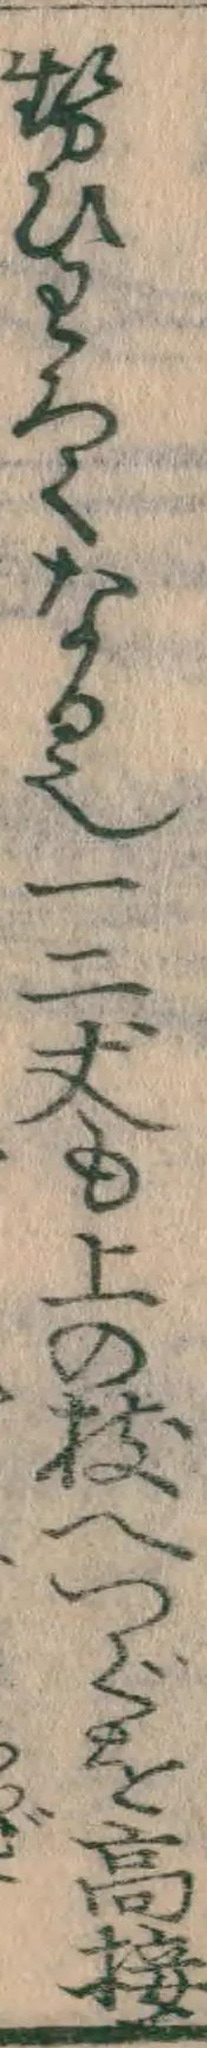勢ひわろくなる也一二丈も上の枝へつぐを高接
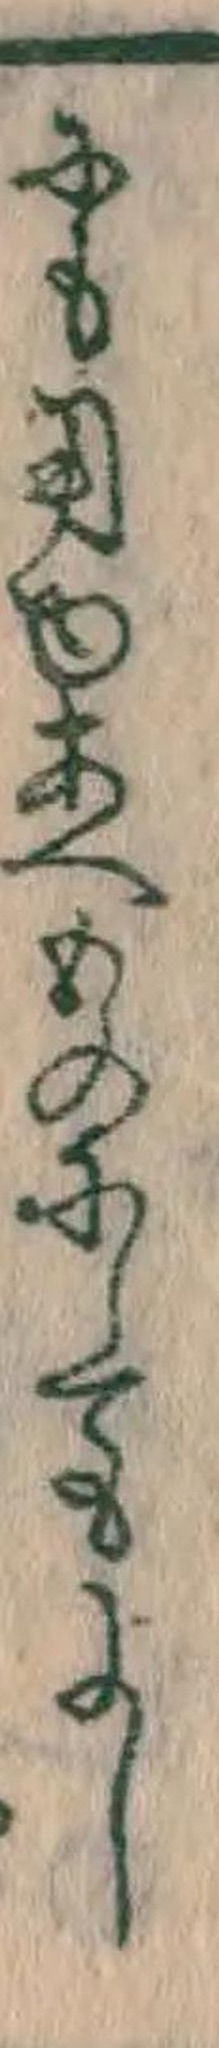にも用ゆあへものにしてもよし
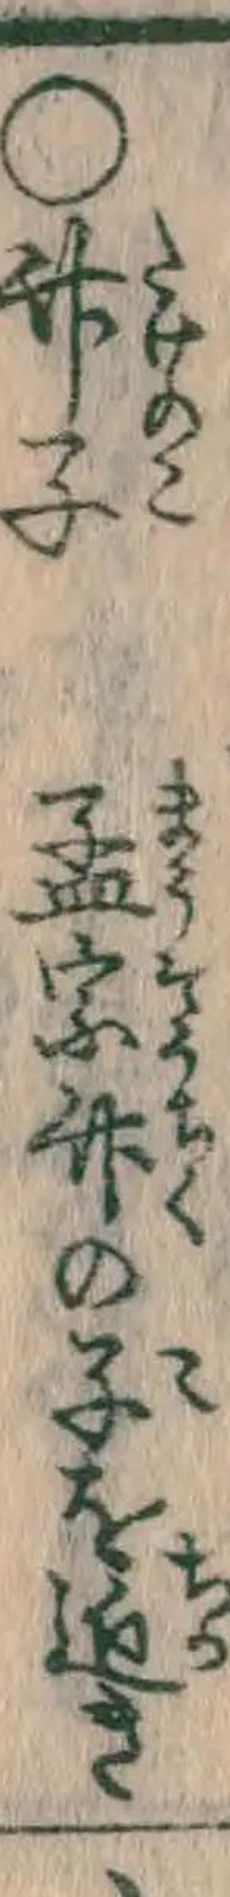○竹子孟宗竹の子を近き
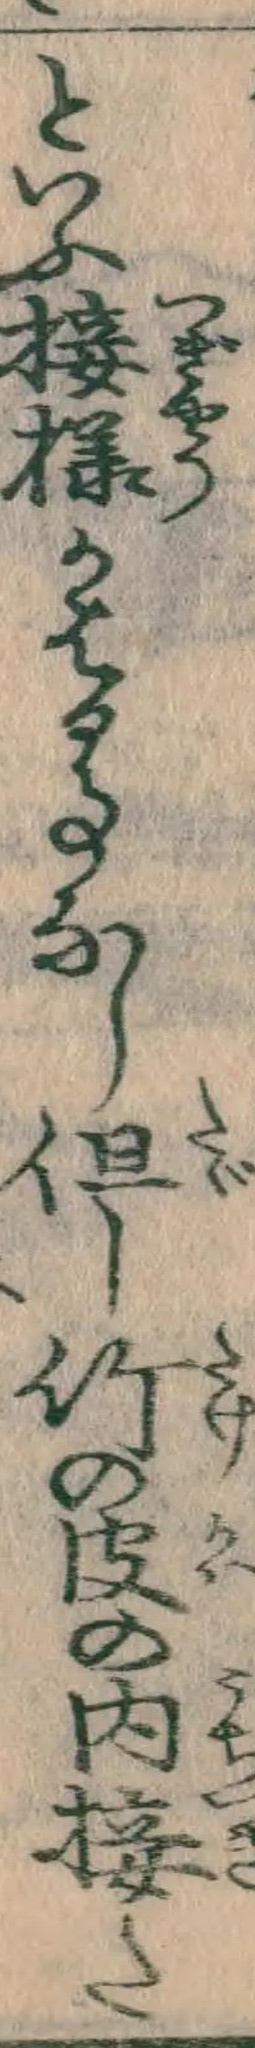といふ接様かはる事なし但し竹の皮の内接た
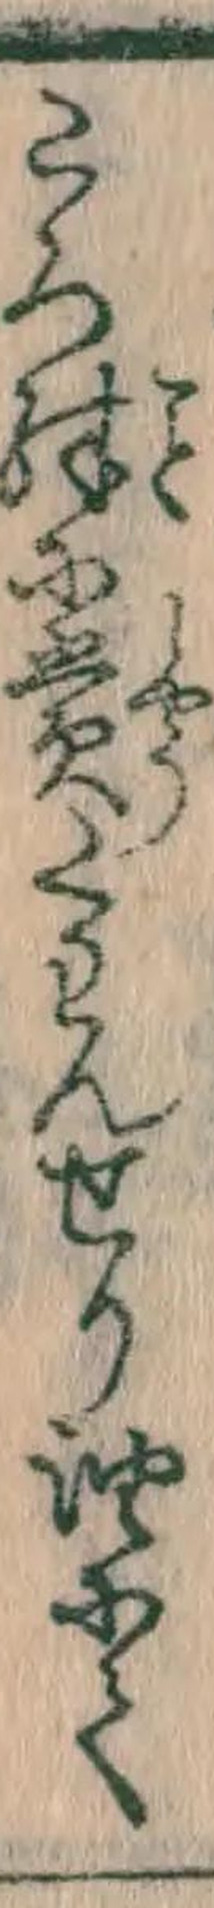ころ殊に賞くわんせり油にて
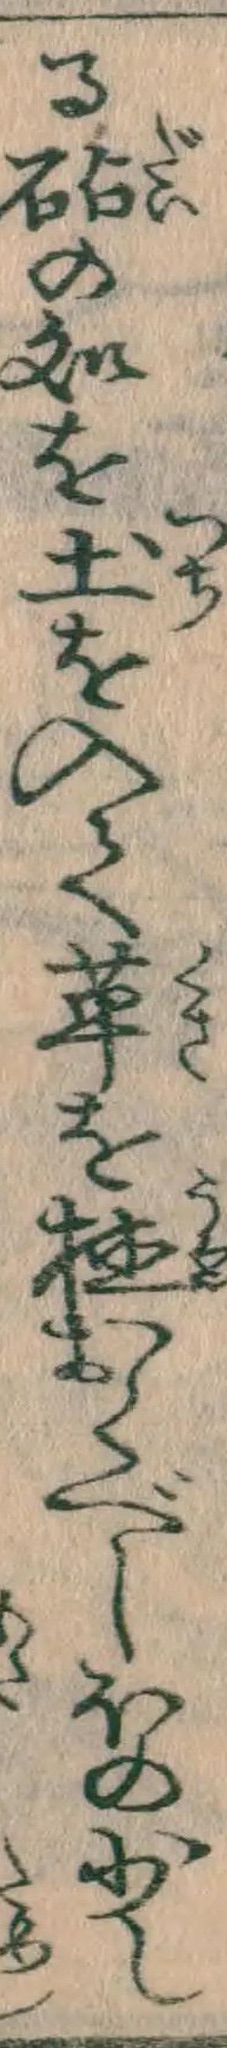る砧の処を土を入て草を植おくべしほの少し
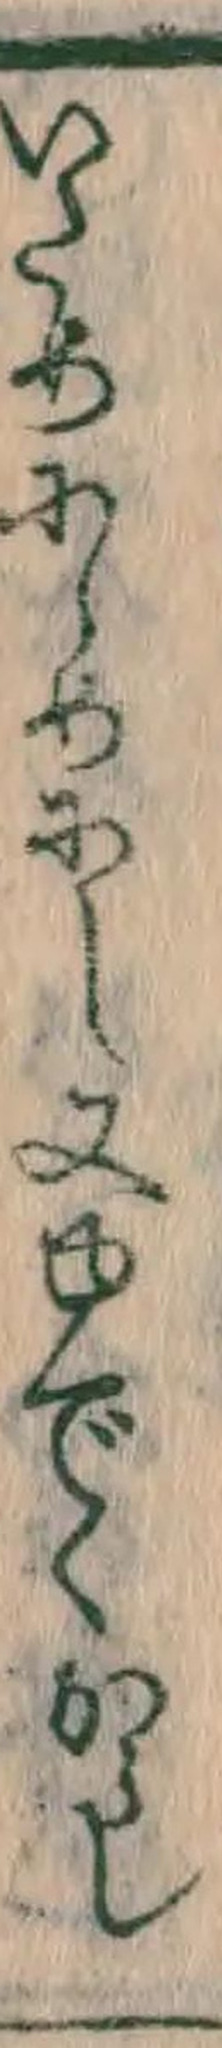いためにしめにし又ゆでゝからし
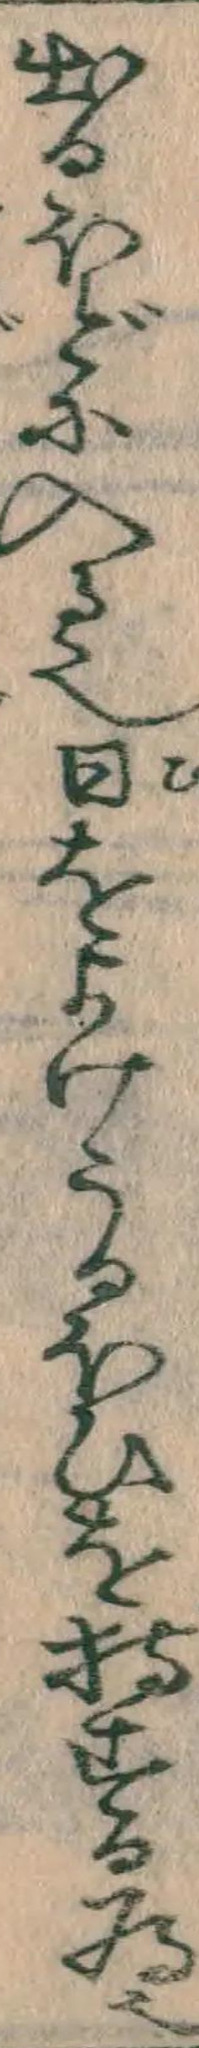出るほどに入る也日をよけうるほひを持する為也
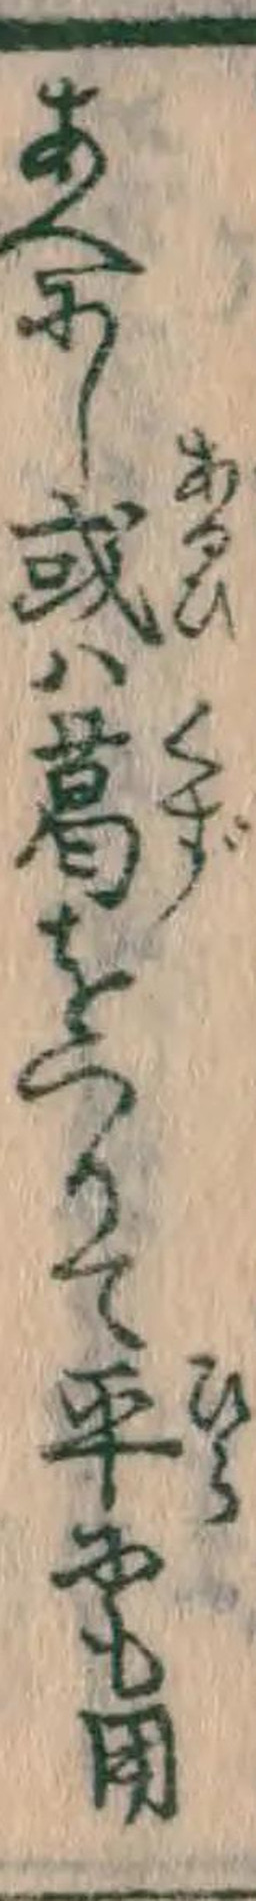あへにし或は葛をつりて平にも用
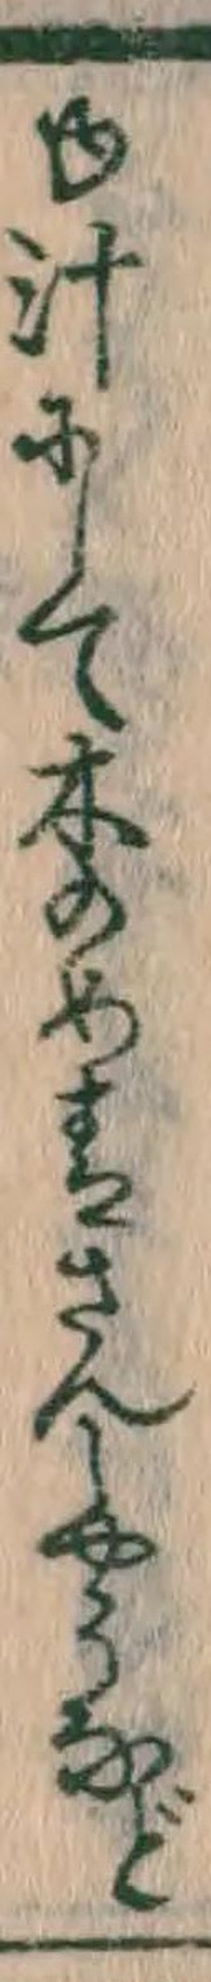ゆ汁にして木のめはさんしやうなど
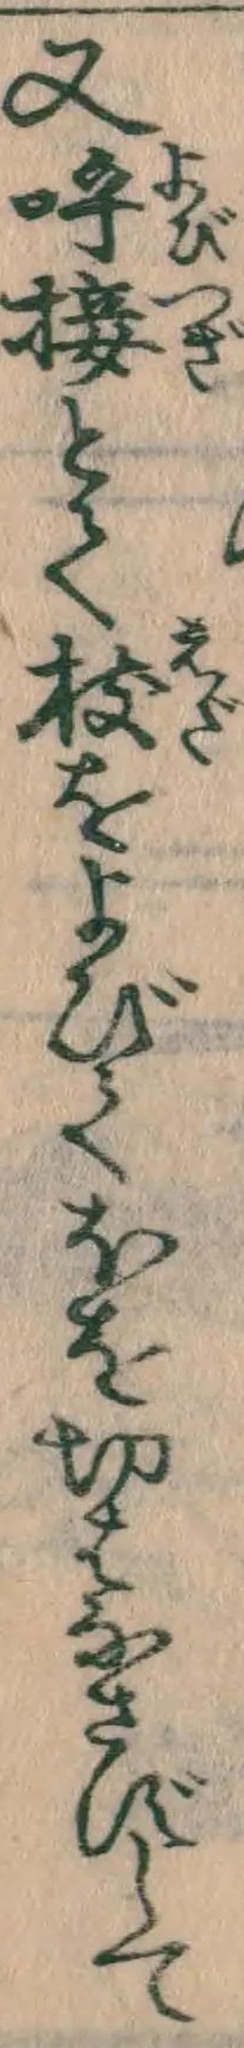又呼接とて枝をよびてほを切はなさずして
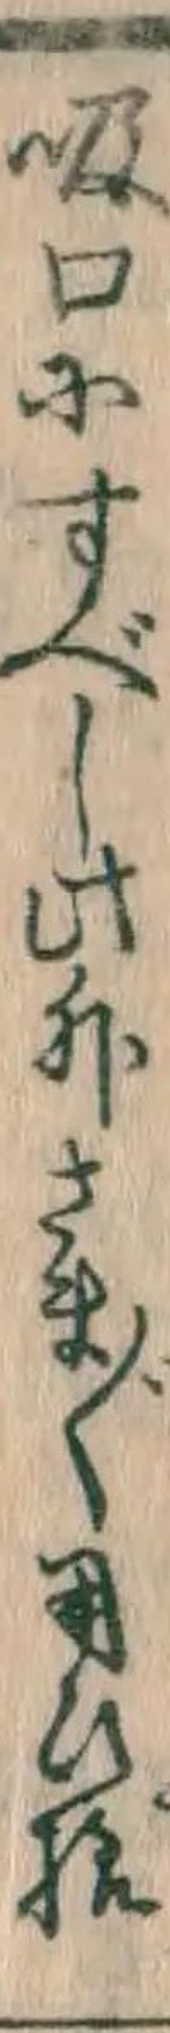吸口にすべし此外さま〴〵用ひ様
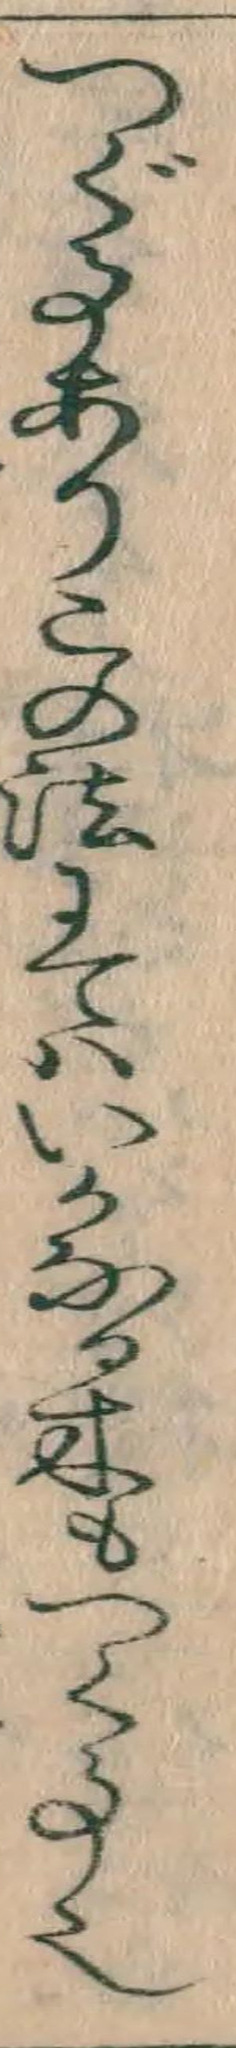つぐ事ありこの法にてはいかなる木もつくる也
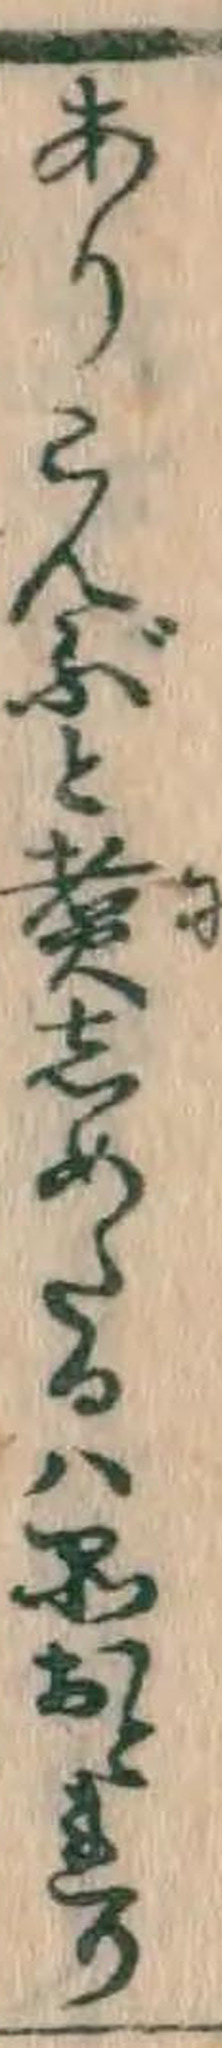ありこんぶと煮しめたるは品おとれり
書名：広益秘事大全 3巻. [5]
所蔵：国立国会図書館 National Diet Library, JAPAN
